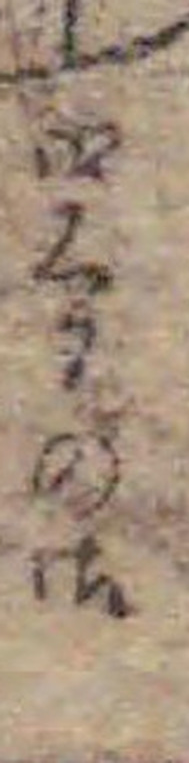四くわの御
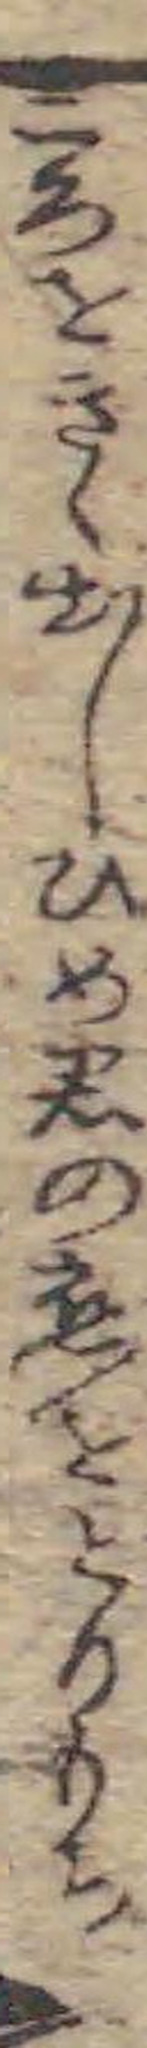ころをきゝ出しひめ君の恋をとりもち
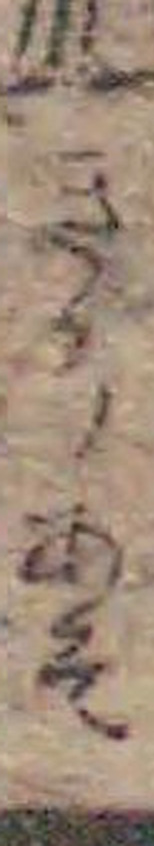きうあそ
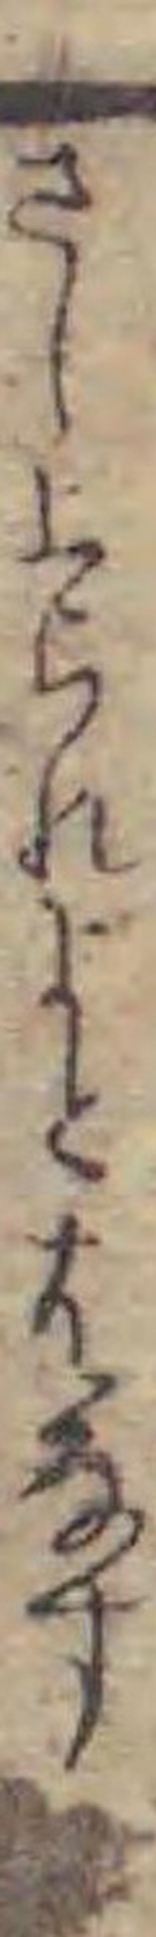さし上られよとはなす
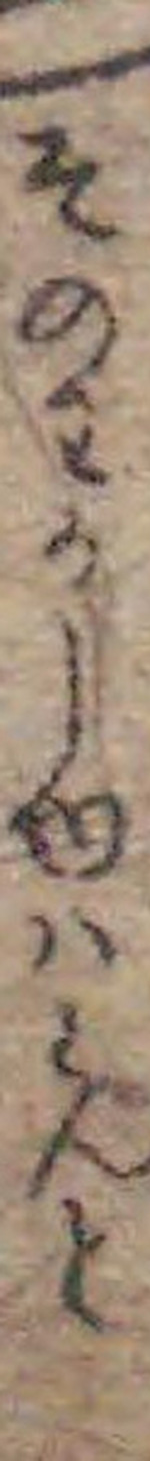そのわかしゆはとんと
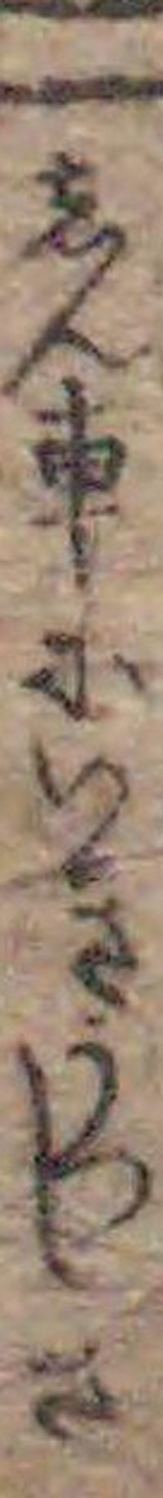しん車にいきうつしさ
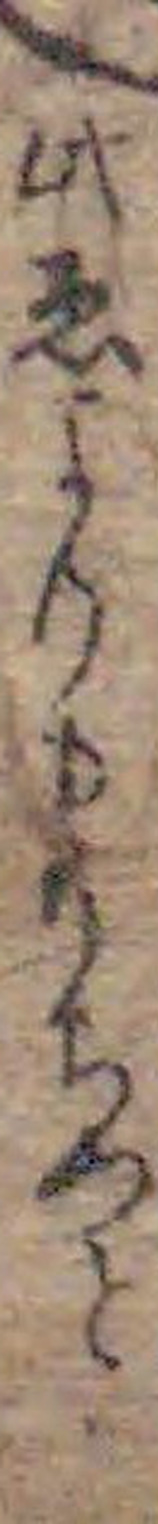此ゑよりもうちつと
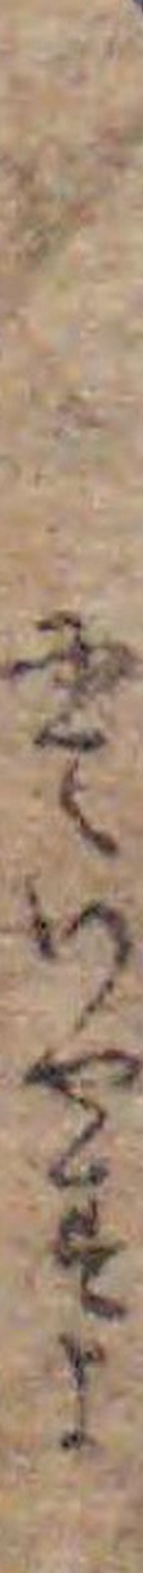にていやすよ

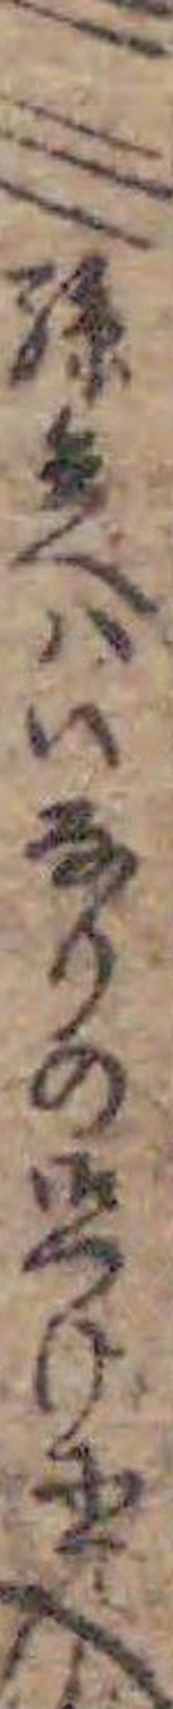孫兵へはいなりの御つけにて
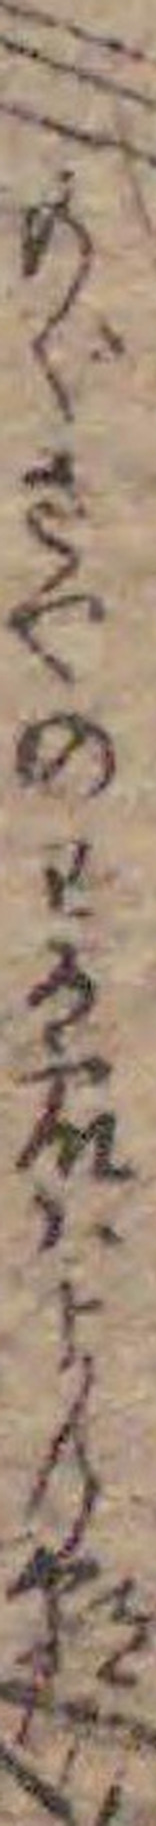もぐさやのわか首はより朝
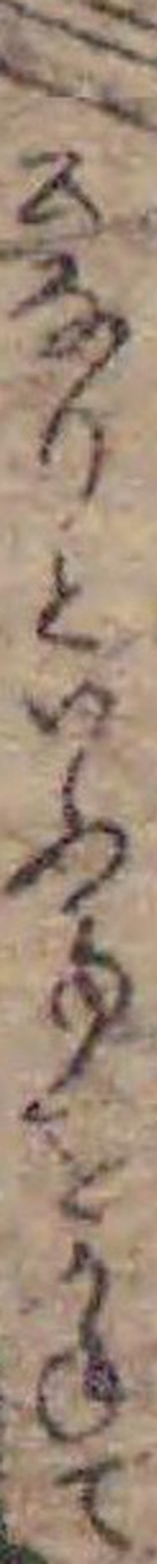公なりといふ事をかねて
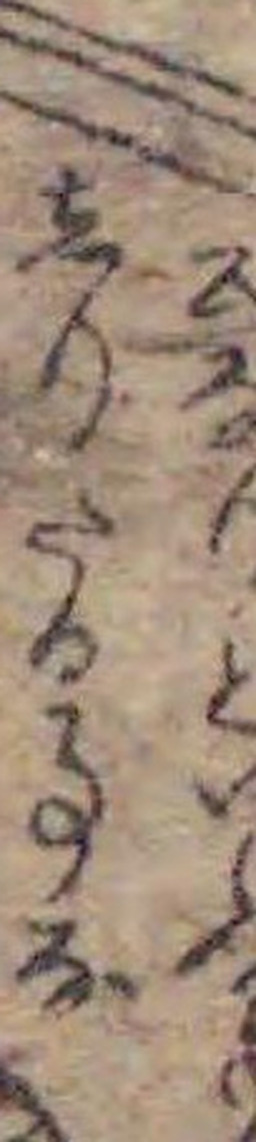しりたる事な
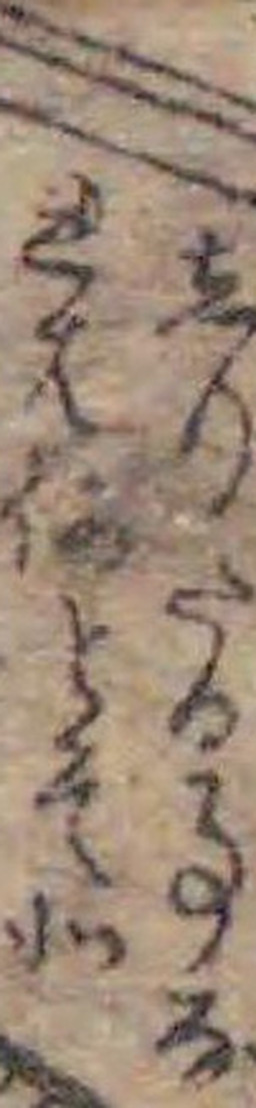れは何とそ北
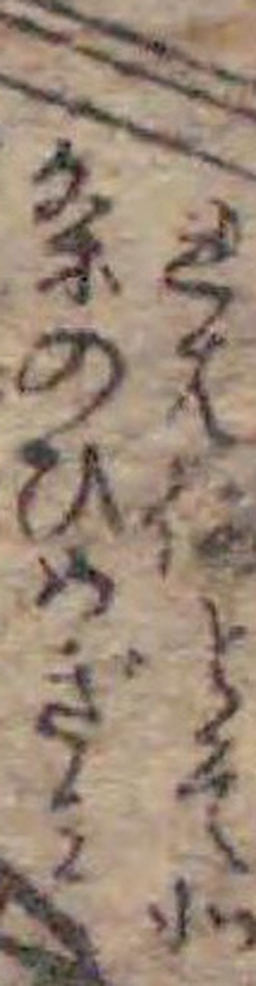条のひめぎみ
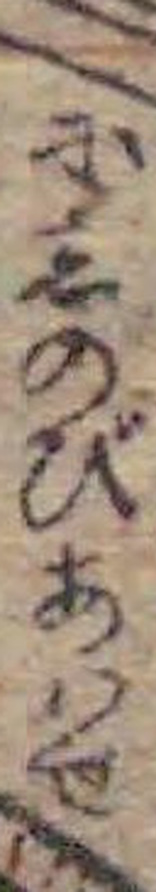にしのびあはせ
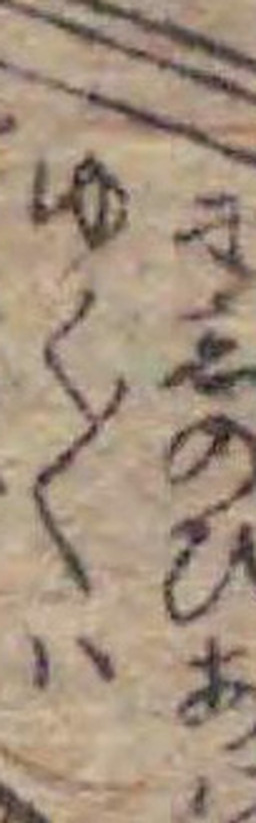ゆく〳〵は
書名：三舛増鱗組 : 3巻
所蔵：国立国会図書館 National Diet Library, JAPAN
